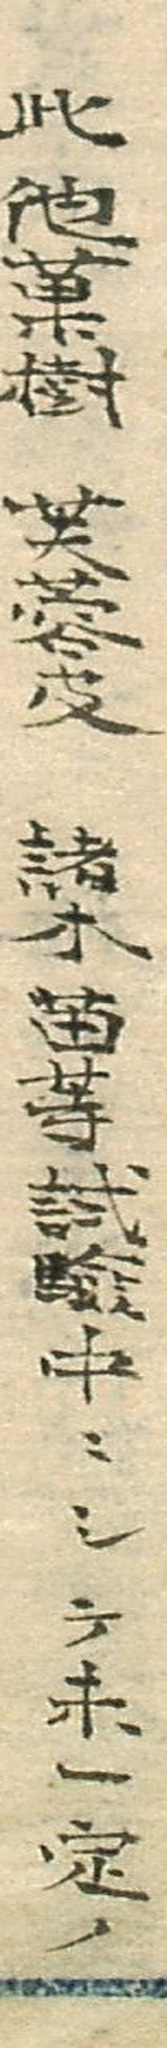此他菓樹芙蓉皮諸木苗等試験中ニシテ未一定ノ
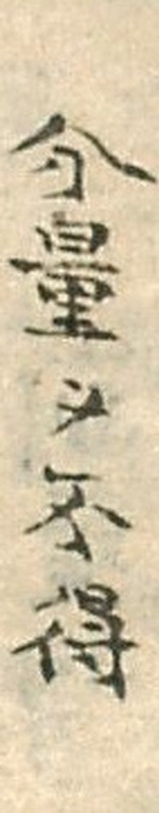分量ヲ不得
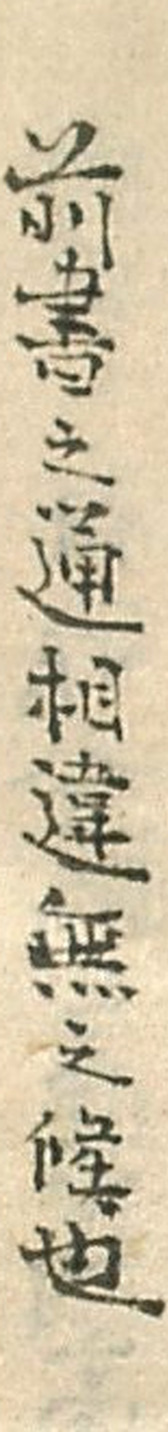前書之通相違無之候也
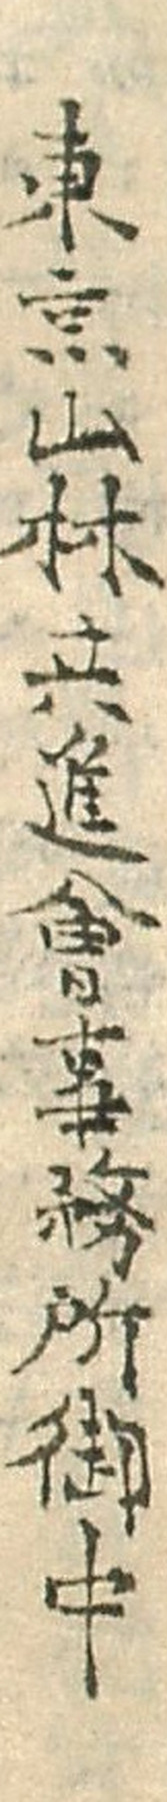東京山林共進会事務所御中
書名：山林共進会取調書
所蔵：鳴門教育大学 Naruto University of Education
